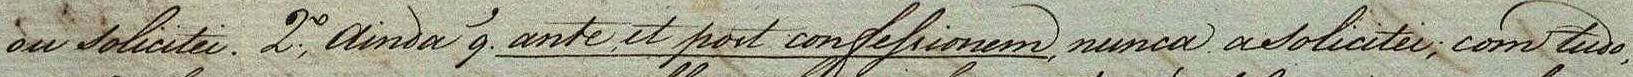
ou solicitei. 2.º, ainda q̄ ante, et post confessionem, nunca a solicitei; comtudo
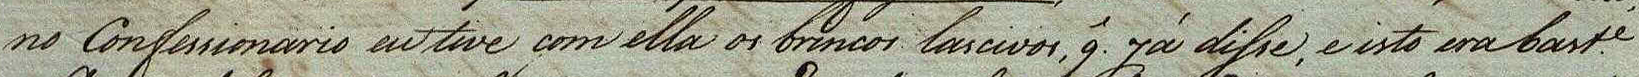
no Confessionario eu tive com ella os brincos lascivos, q̄ já disse, e isto era bast.e
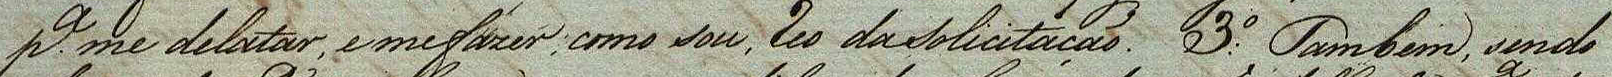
p.a me delatar, e me fazer como sou, Reo da solicitaçaõ. 3.º Tambem, sendo
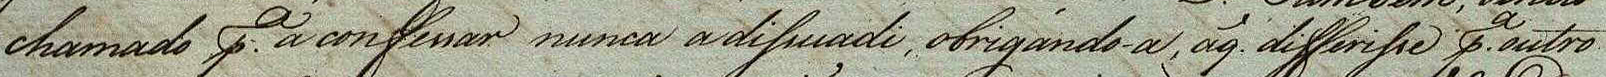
chamado p.a a confessar nunca a dissuadi, obrigando-a, a q̄ differisse p.a outro
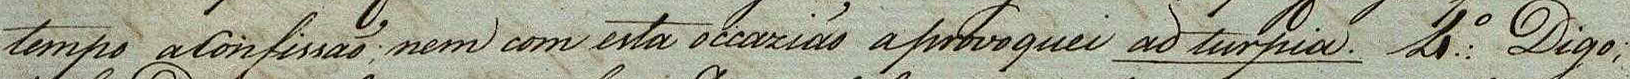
tempo a confissaõ, nem com esta occazião a provoquei ad turpia. 4.º: Digo;
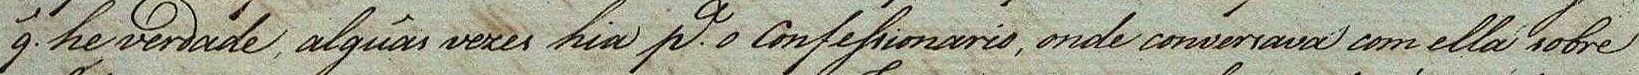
q̄ he verdade, alguās vezes hia p.a o confessionario, onde conversava com ella sobre
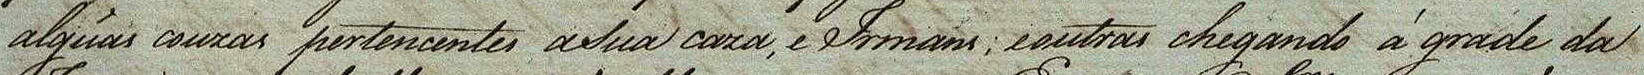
algūas couzas pertencentes a sua caza, e Irmans; e outras chegando á grade da
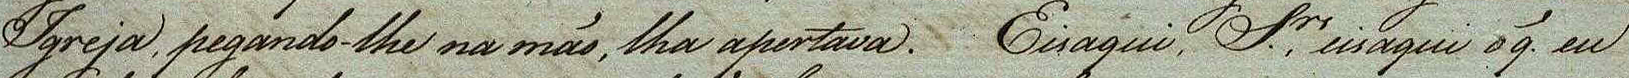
Igreja, pegando-lhe na mão, lha apertava. Eis aqui S.rs, eis aqui o q̄ eu
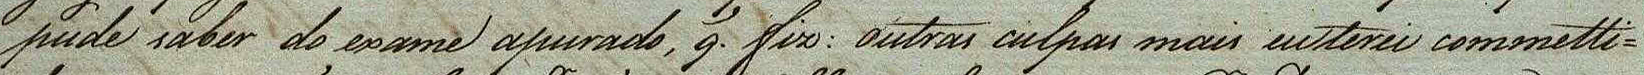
pude saber do exame apurado, q̄ fiz: outras culpas mais eu terei commetti
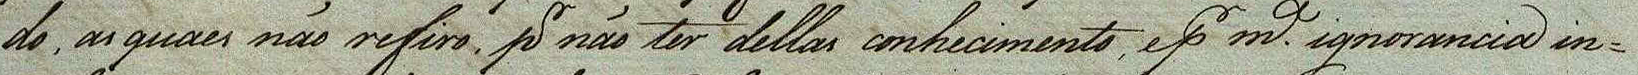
do, as quaes não refiro, p.r naõ ter dellas conhecimento, e p.r m.a ignorancia in
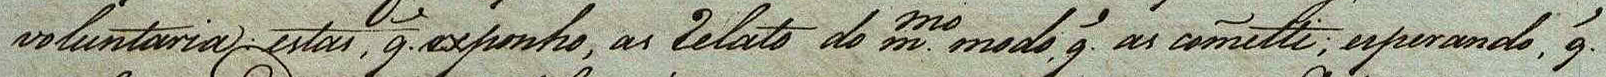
voluntaria estas, q̄ exponho, as Relato do m.mo modo q̄ as com̄etti; esperando, q̄
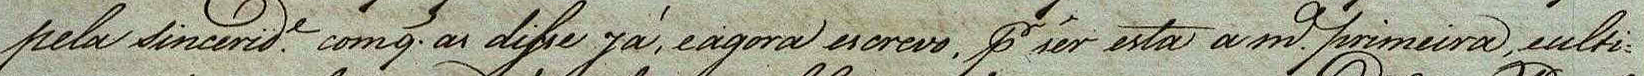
pela sincerid.e com q̄ as disse já, e agora escrevo, p.r ser esta a m.a primeira, e ulti
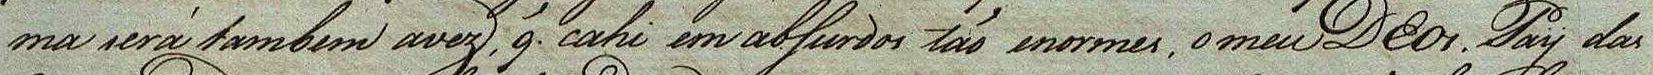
ma será tambem a vez, q̄ cahi em absurdos taõ enormes, o meu Deos. Pay das
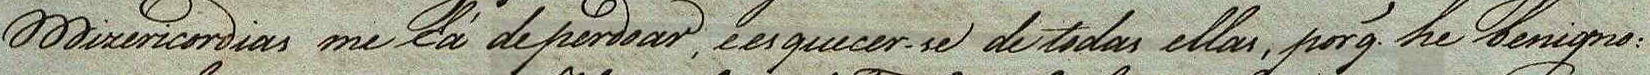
mizericordias me há de perdoar, e esquecer-se de todas ellas, porq̄ he benigno:
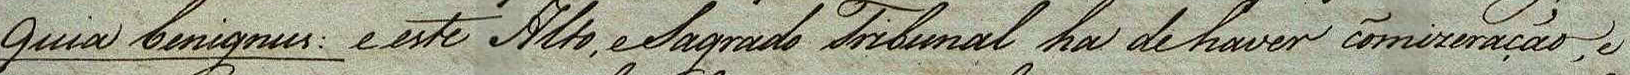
Quia benignus: e este Alto e Sagrado Tribunal ha de haver cōmizeração, e
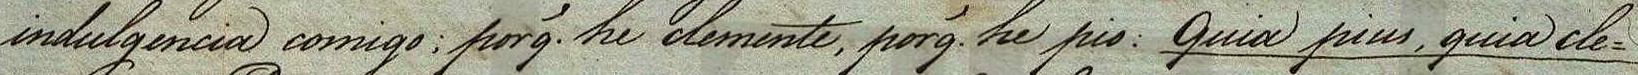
indulgencia comigo: porq̄ he clemente, porq̄ he pio. Quia pius, quia cle
